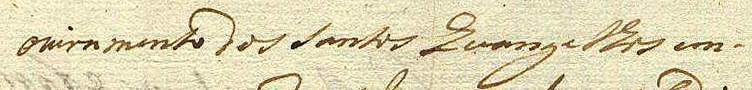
o iuramento dos santos Euangelhos em
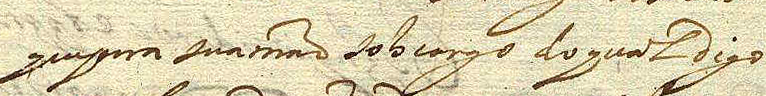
que pera sua maõ sob cargo do qual digo
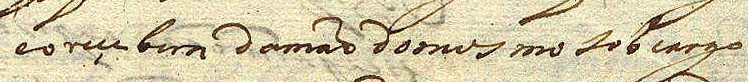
e o recebera da maõ do mesmo sob cargo
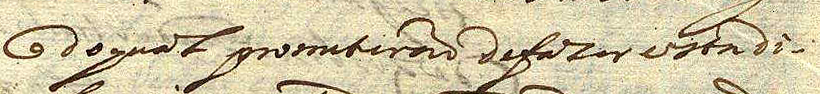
do qual prometeraõ de fazer esta di
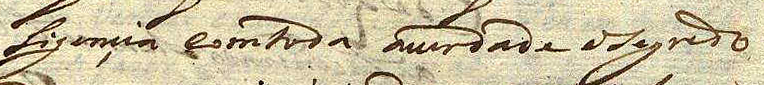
Ligençia com toda a uerdade e segredo
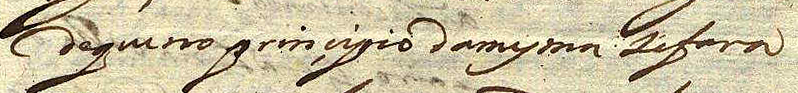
de que no principio da mesma se fara
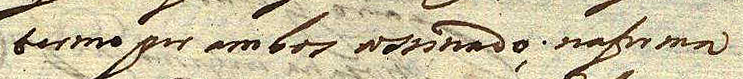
termo por ambos assinado; na forma
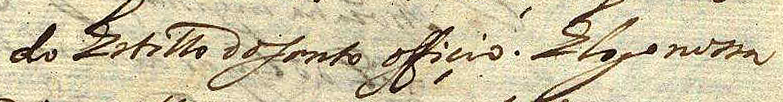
do Estillo do santo officio. E logo nessa
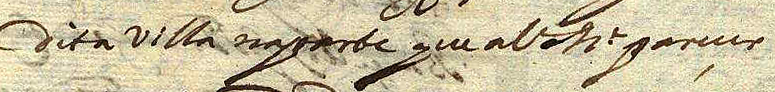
dita villa na parte que a V M.e parecer
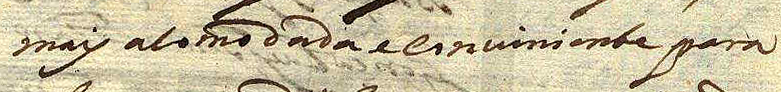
mais acomodada e conuiniente para
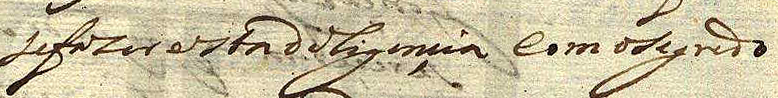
se fazer esta deligencia com o segredo
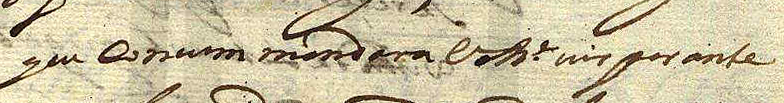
que conuem mandara V M.e uir perante
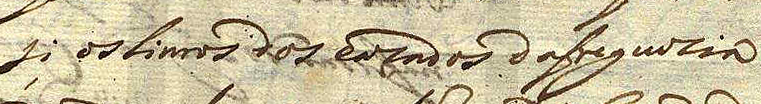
si, os liuros dos cazados da freguezia
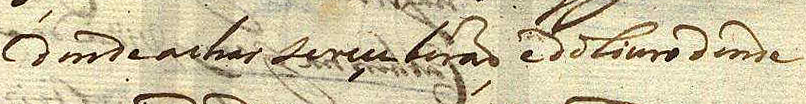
donde achar se receberaõ, e do liuro donde
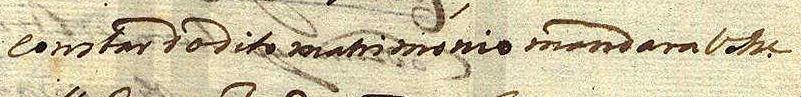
constar do dito matrimonio mandará V M.e
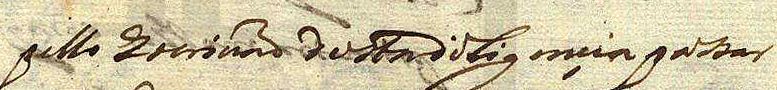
pello Escriuaõ desta diligencia passar
